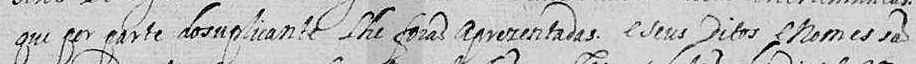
que por parte do suplicante lhe foraõ aprezentadas. e seus ditos e nomes saõ
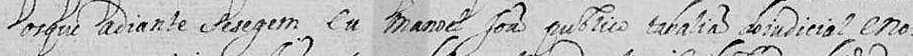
os que adiante se segem eu manoel Joaõ publico tabaliaõ do iudicial e no
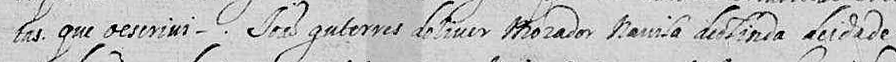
tas que o escriui = Joaõ guterres doliuer morador na uila de olinda de idade
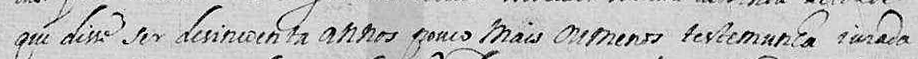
que disse ser de sincoenta annos pouco mais ou menos testemunha iurada
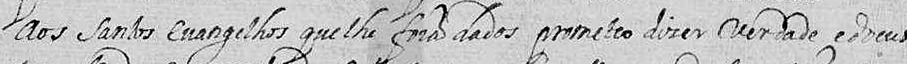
aos Santos Euangelhos que lhe foraõ dados prometeo dizer verdade e do cus
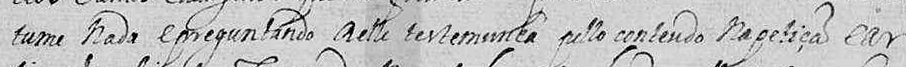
tume nada e preguntando a elle testemunha pello conteudo na petiçaõ e ar
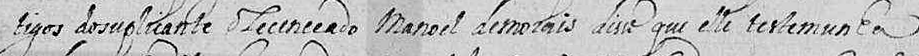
tigos do suplicante o Lecenceado Manoel de morais disse que elle testemunha
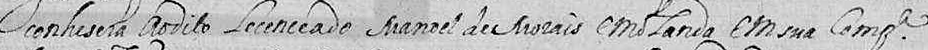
conhesera ao dito Lecenceado Manoel de Morais em olanda em sua Comp.a
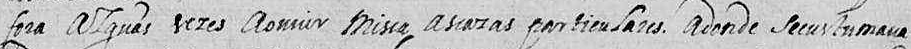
fora alguās vezes a ouuir missa as cazas particulares adonde se custumaua
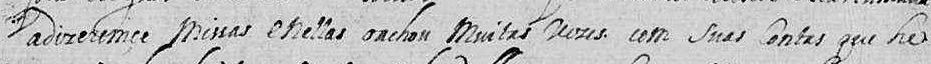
a dizeremce missas e nellas o achou muitas vezes com suas Contas que he
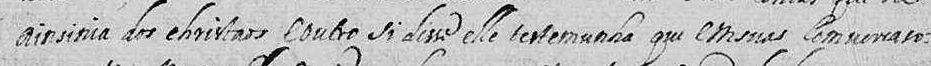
a insinia dos christaos E outrosi disse elle testemunha que em suas comuersaso
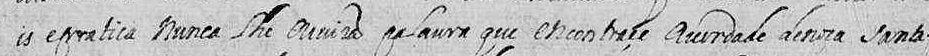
is e pratica nunca lhe ouuiraõ palaura que encontrace a uerdade de nosa santa
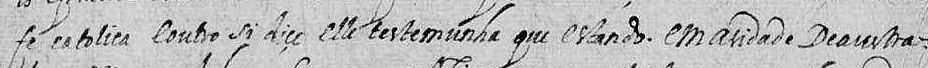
fe catolica e outro si dice elle testemunha que estando em a sidade De anstra
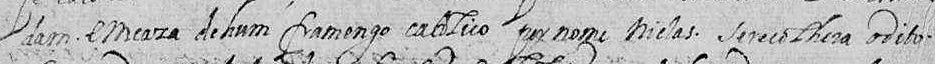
dam em caza de hum framengo catolico por nome niclas se recolhera o dito
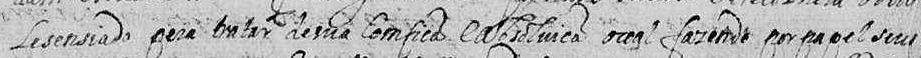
lesensiado pera tratar de sua comfiçã e absoluiçã ou q̄ fazendo por papel seus
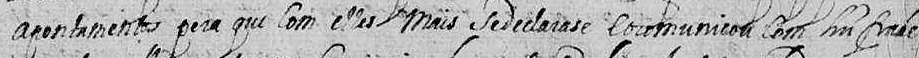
apontamentos pera que com elles mais se declarase e o communicou com hū frade
